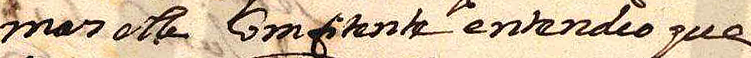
mas elle comfitente entendeo que
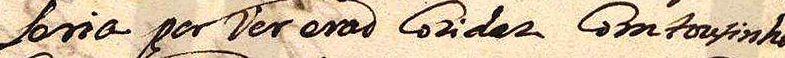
seria por Ver eraõ Cozidas Com tousinho
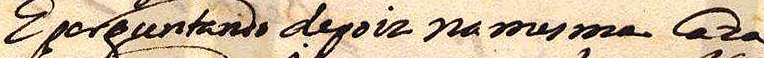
E perguntando depoiz na mesma Caza,
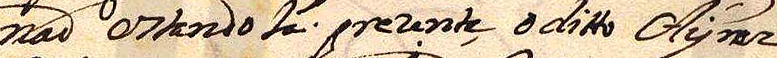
naõ estando Ia. prezente, o ditto Ayrez
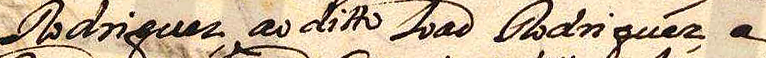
Rodriguez, ao ditto Ioaõ Rodriguez, a
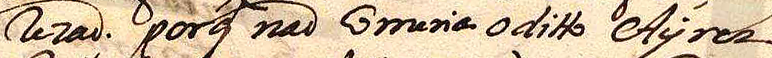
Rezaõ; porqe naõ comeria o ditto Ayrez
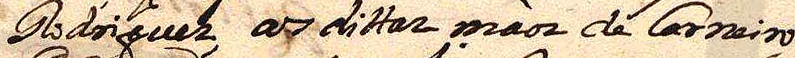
Rodriguez, as dittas mãoz de Carneiro;
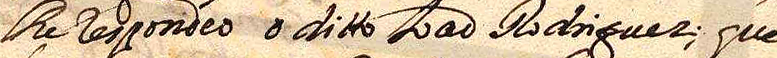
lhe respondeo o ditto Ioaõ Rodriguez; que
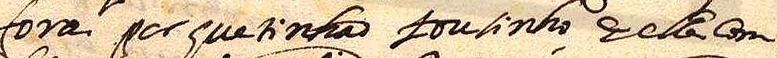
fora porque tinhaõ tousinho, E elle com
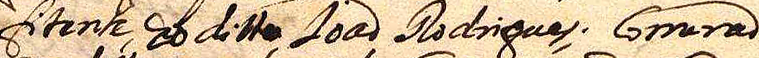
fitente, E o ditto Ioaõ Rodrigues; comeraõ
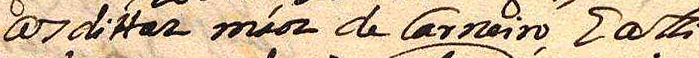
as dittaz maoz de Carneiro, E alli
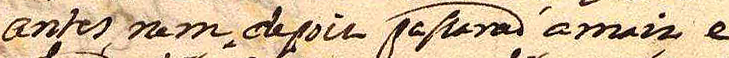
antes, nem depois passaraõ a maiz, e
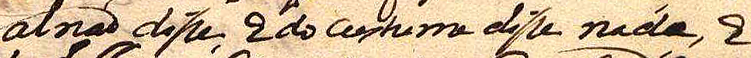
al naõ disse, E do custume disse nada, E
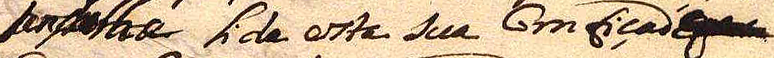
sendolhe lida esta sua Comfiçaõ ___
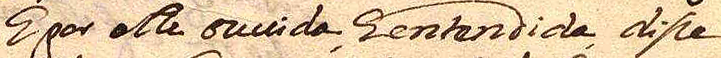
E por elle ouuida, E entendida, disse
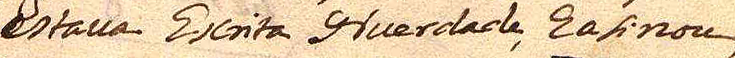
estaua Escrita de uerdade, E asinou
